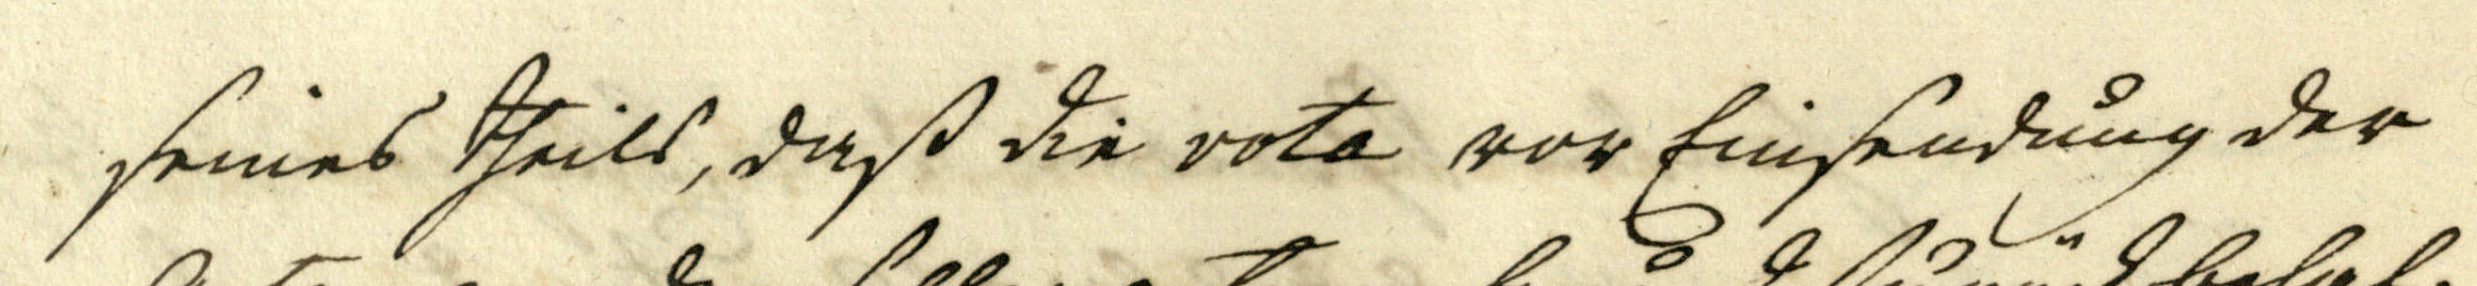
seines Theils, daß die vota vor Einsendung der
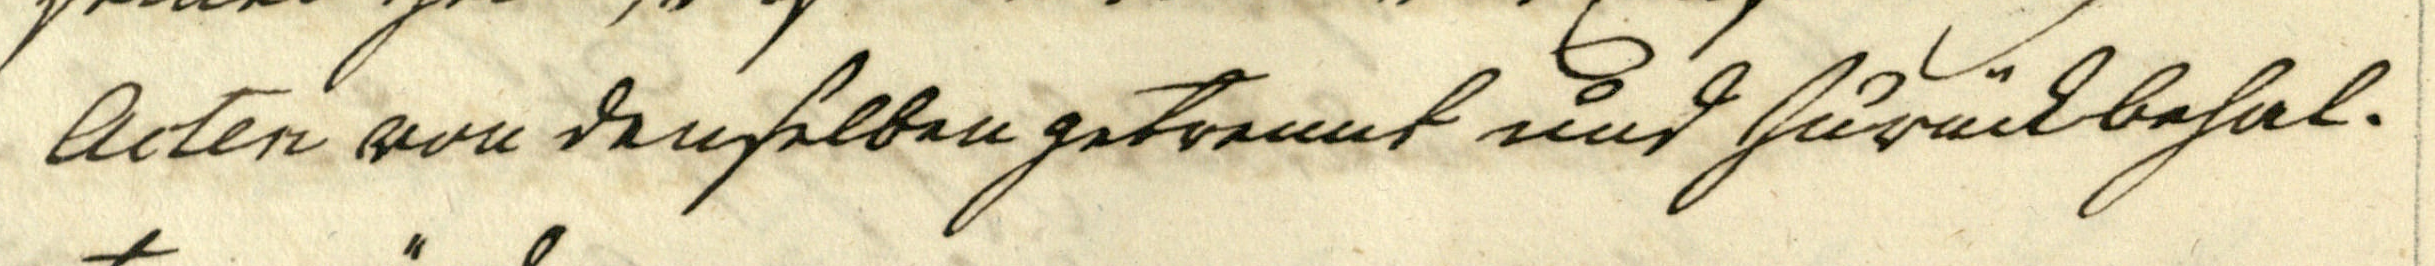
Acten von denselben getrennt und zurückbehal¬
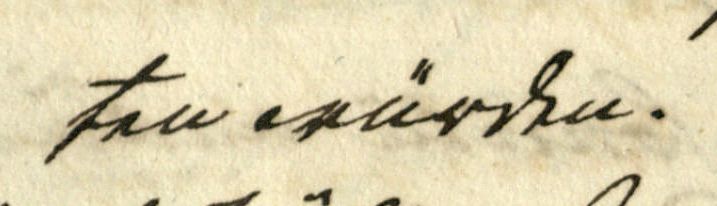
ten würden.
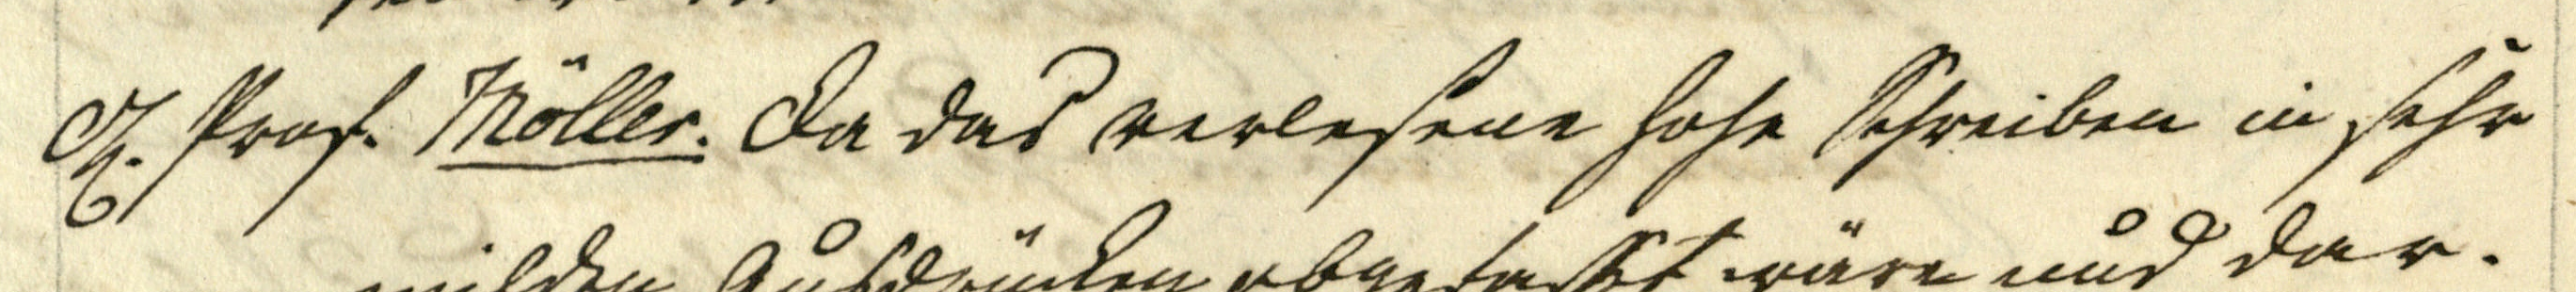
dh. Prof. Möller. Da das verlesene hohe Schreiben in sehr
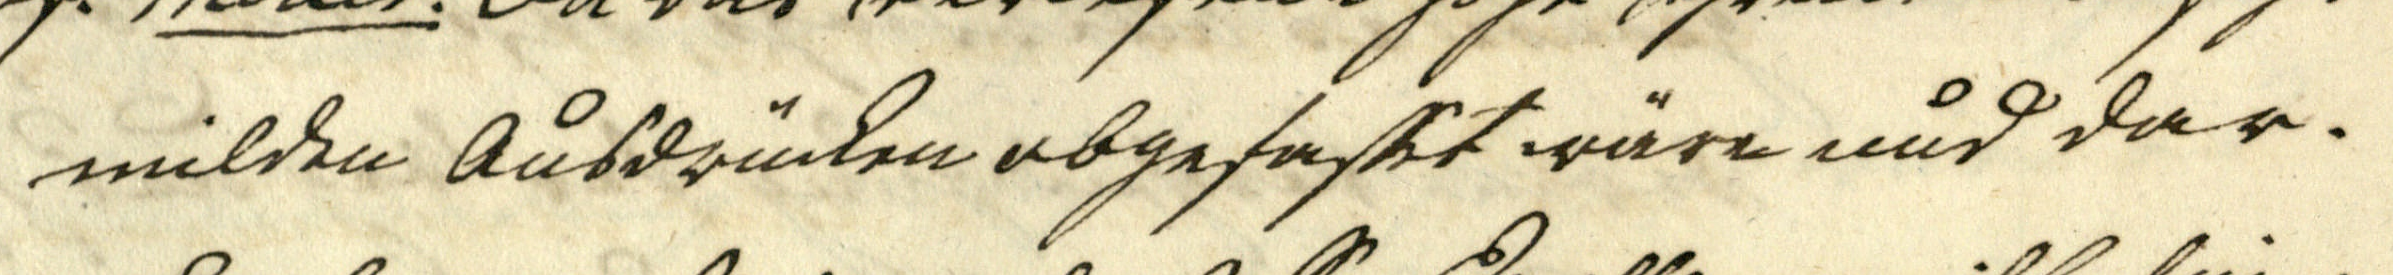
milden Ausdrücken abgefasset wäre und dar¬
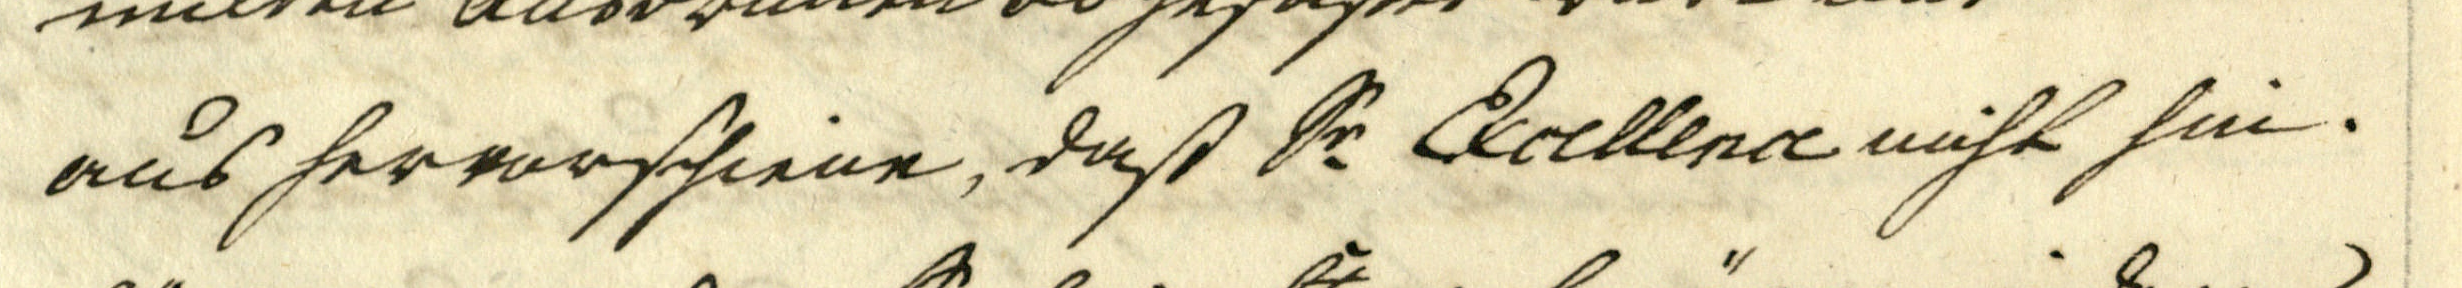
aus hervorschiene, daß Sr Excellence nicht hin¬
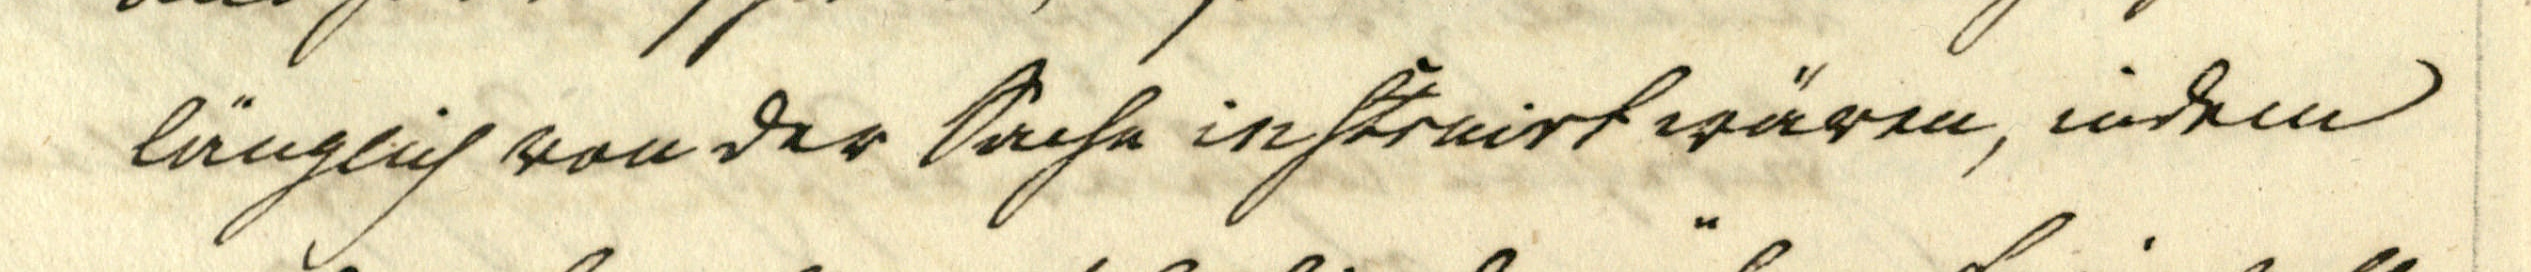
länglich von der Sache instruirt wären, indem
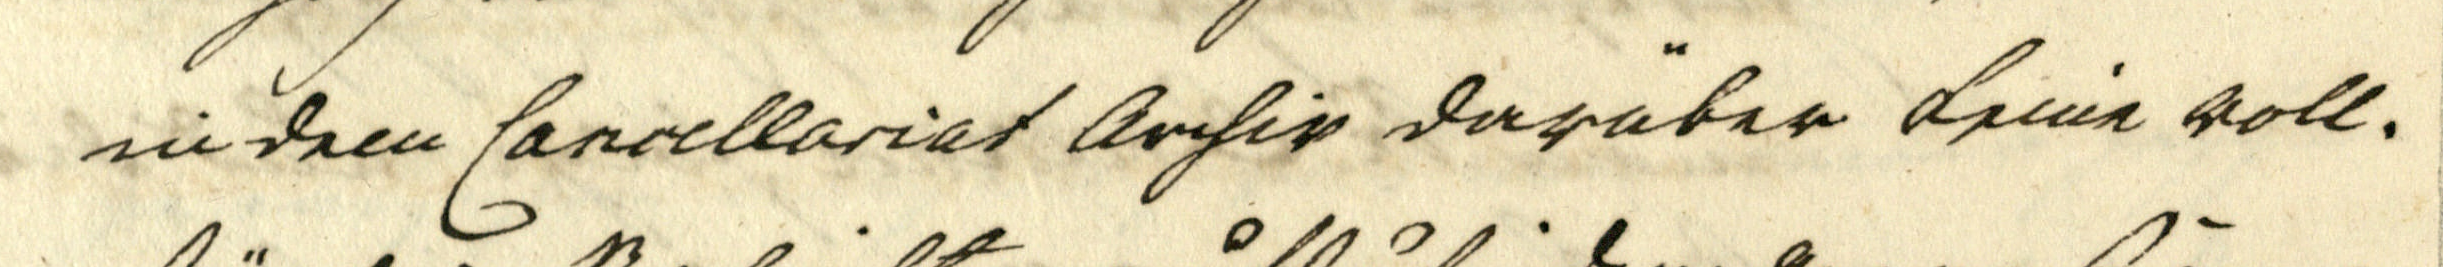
in dem Cancellariat Archiv darüber keine voll¬
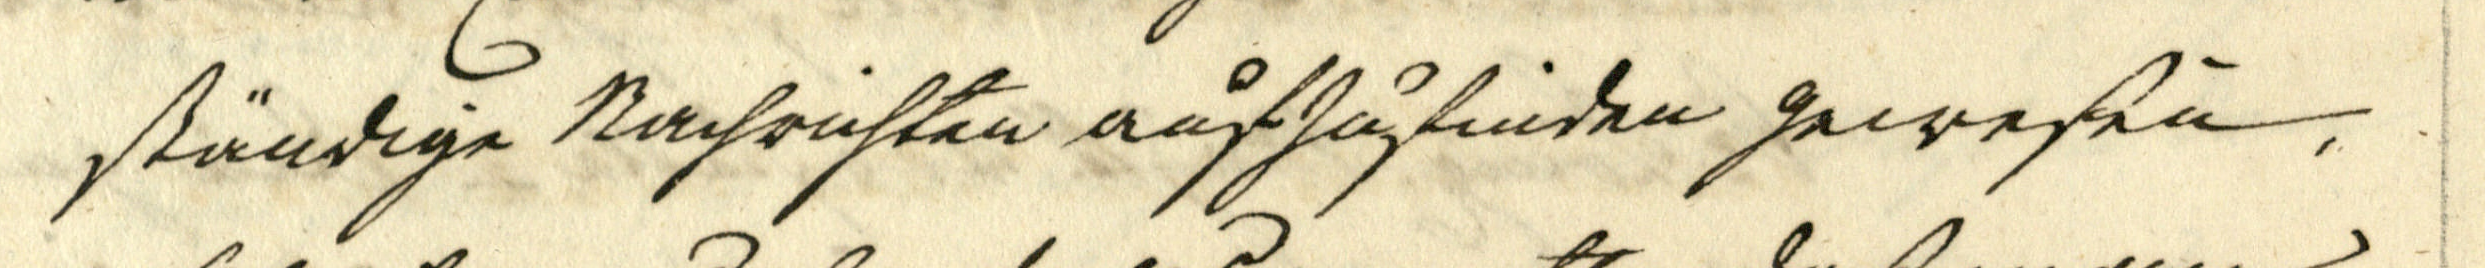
ständige Nachrichten aufzufinden gewesen,
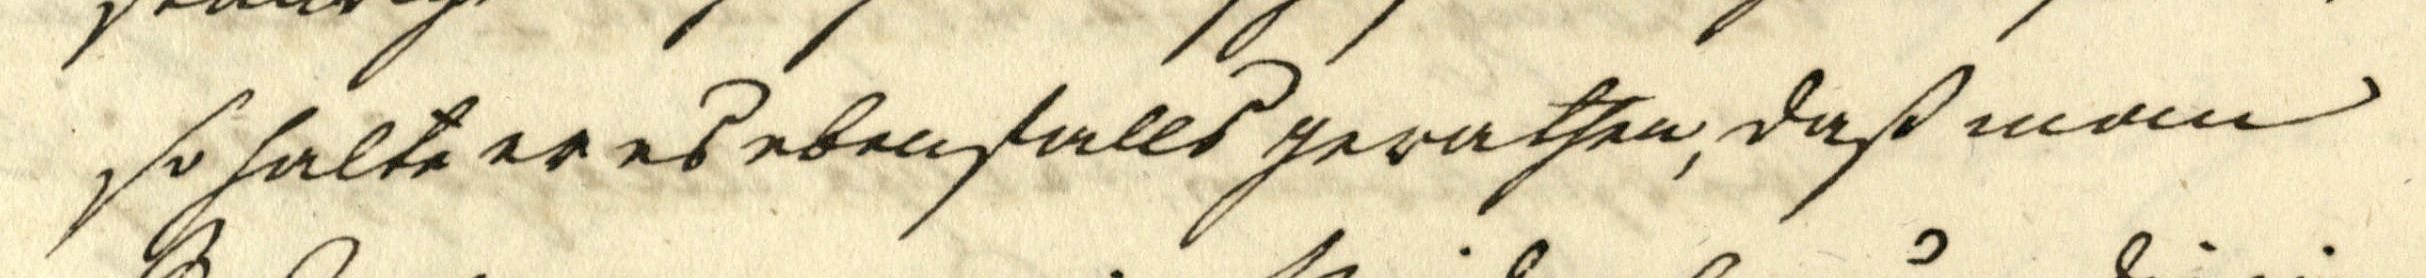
so halte er es ebenfalls gerathen, daß man
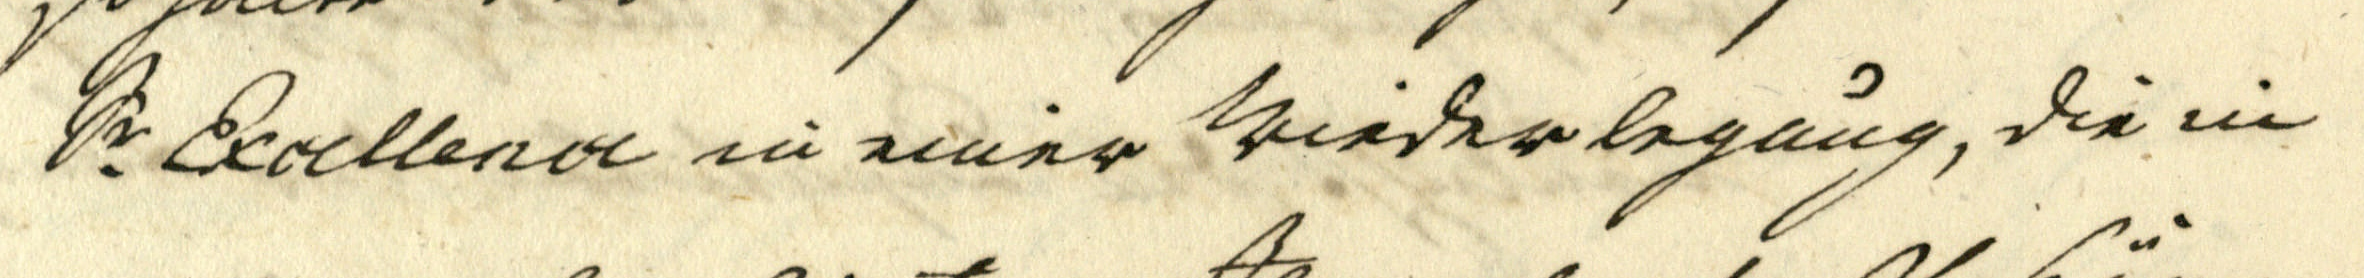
Sr Excellence in einer Wiederlegung, die in
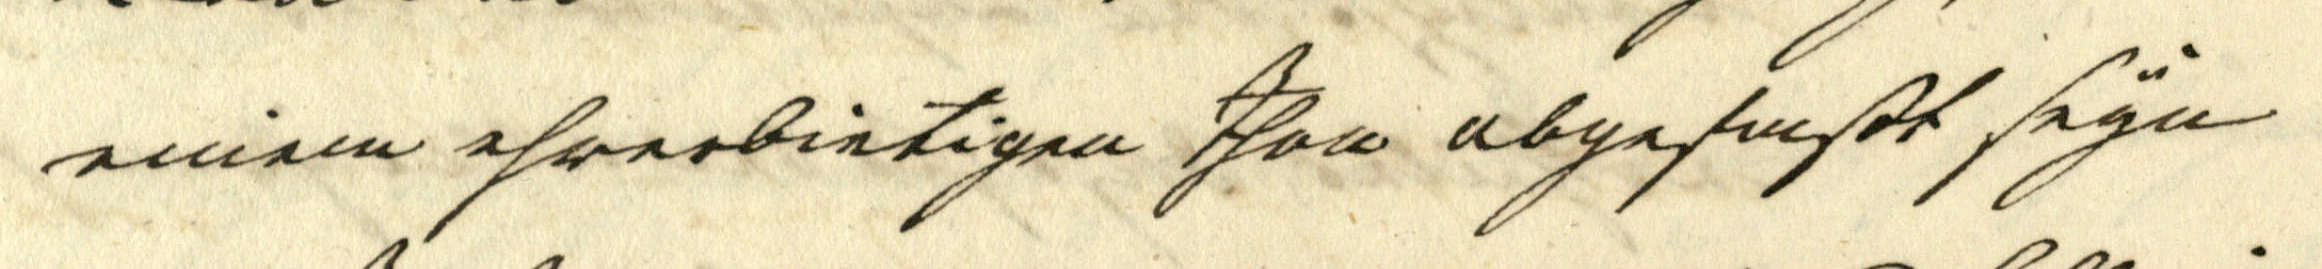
einem ehrerbietigen Thon abgefaßt seÿn
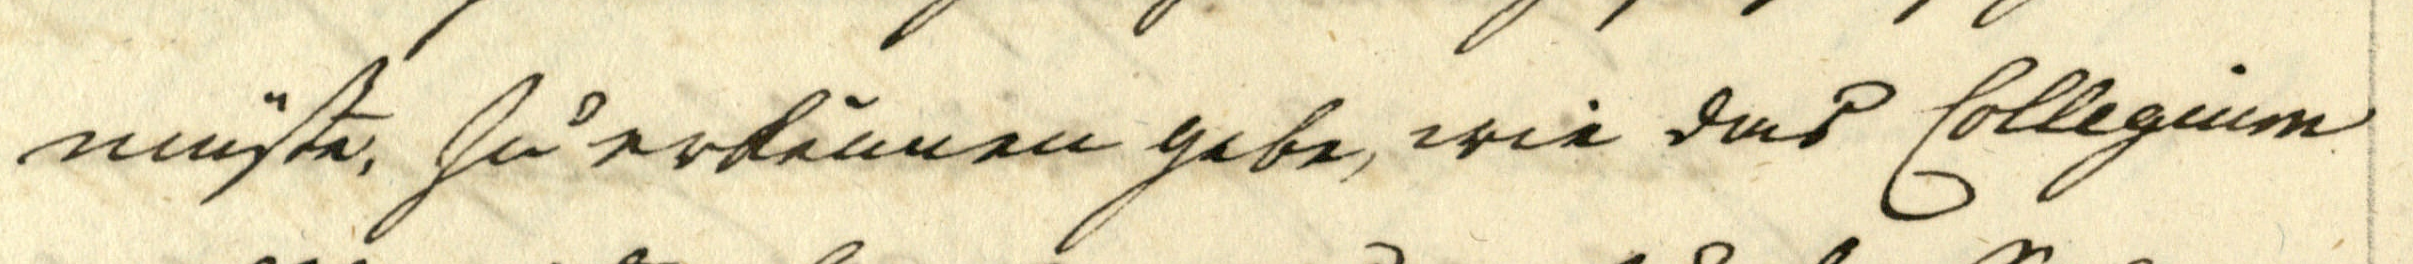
müßte, zu erkennen gebe, wie das Collegium
